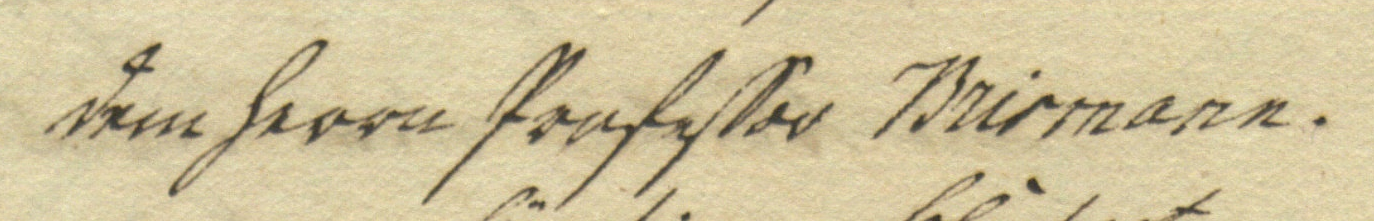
dem Herrn Professor Brismann.
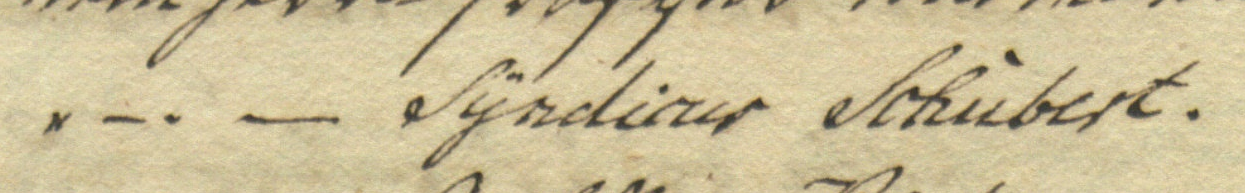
Sÿndicus Schubert.
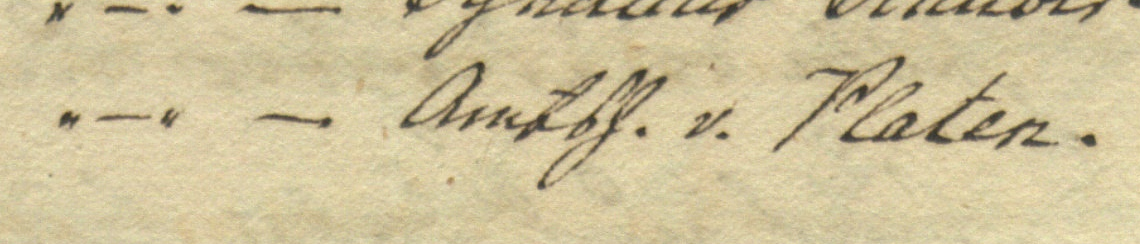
Amtsh. v. Platen.
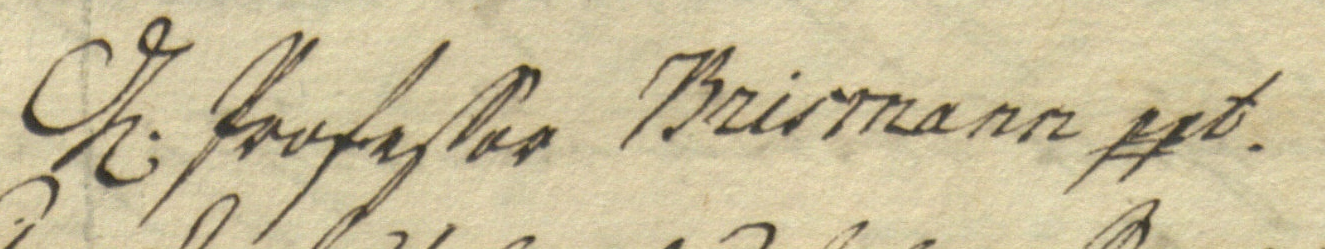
dh. Professor Brismann ppt.
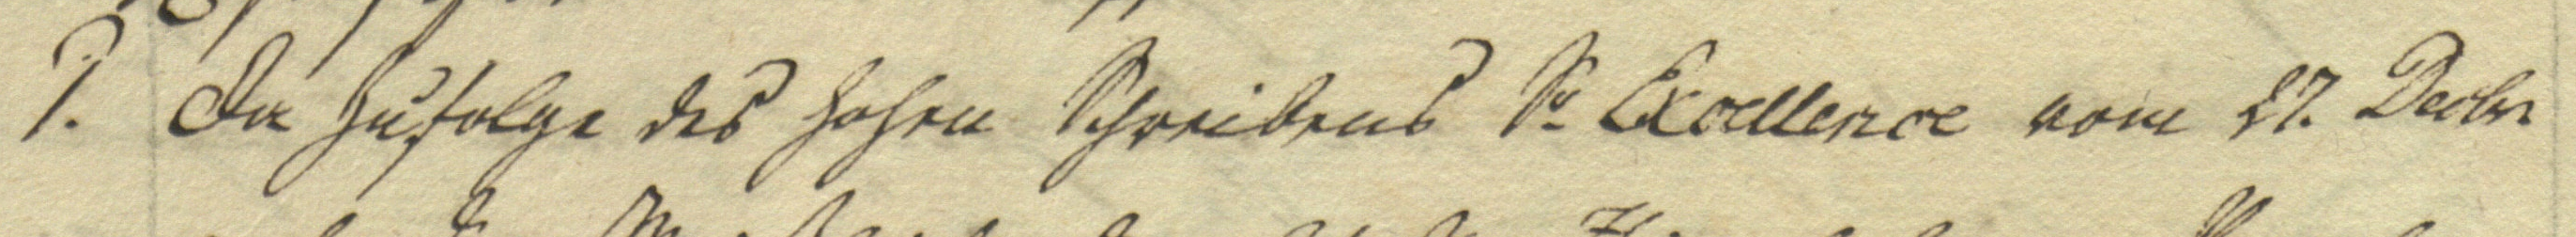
1. Da zufolge des hohen Schreibens Sr Excellence vom 27. Decbr.
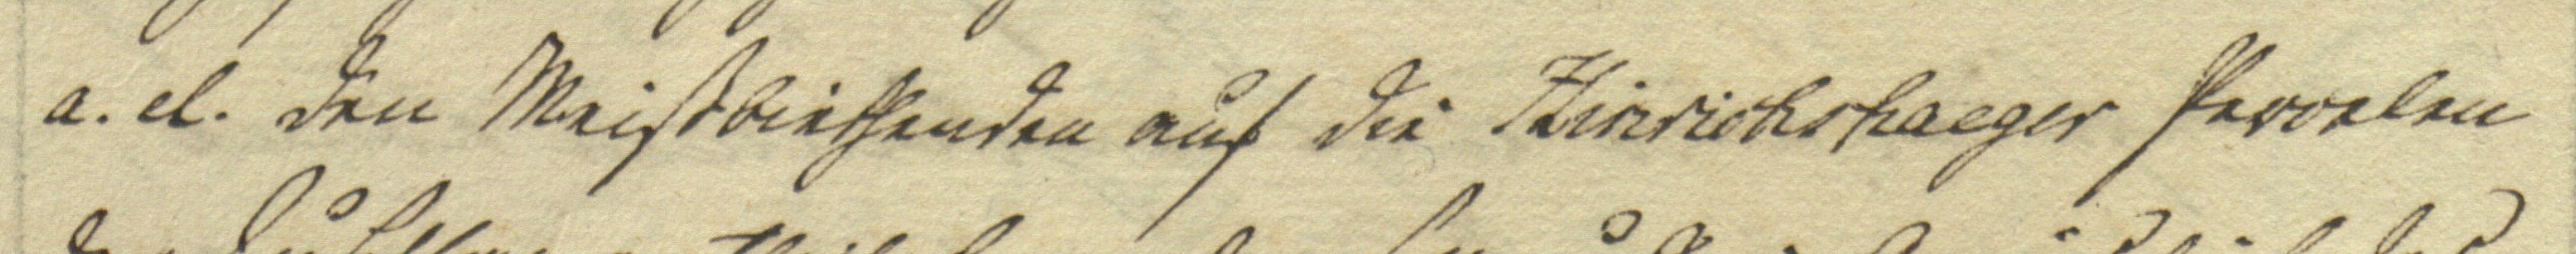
a. el. den Meistbiethenden auf die Hinrichshaeger Percelen
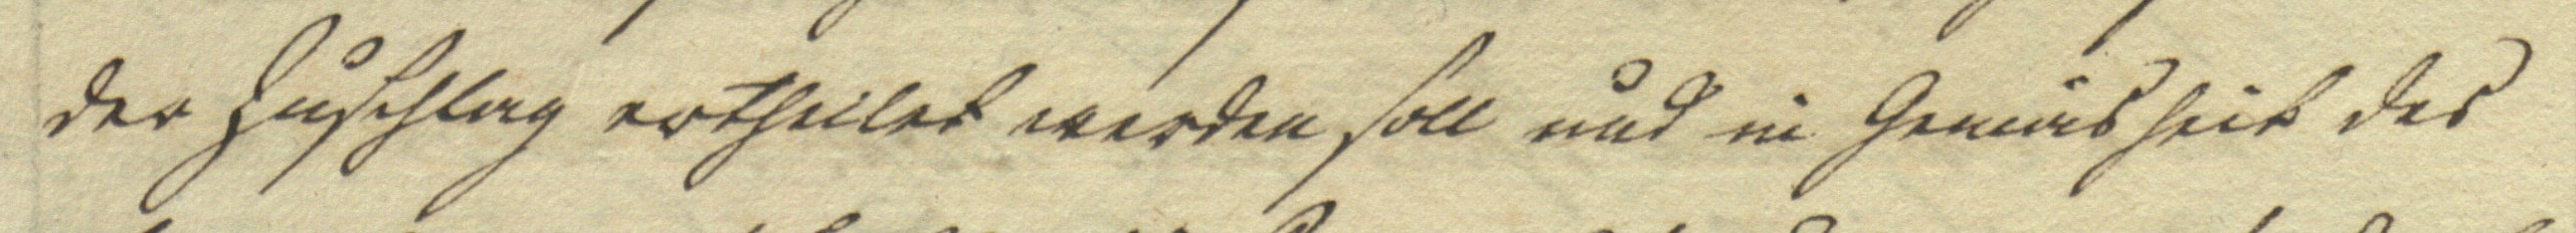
der Zuschlag ertheilet werden soll und in Gemäsheit des
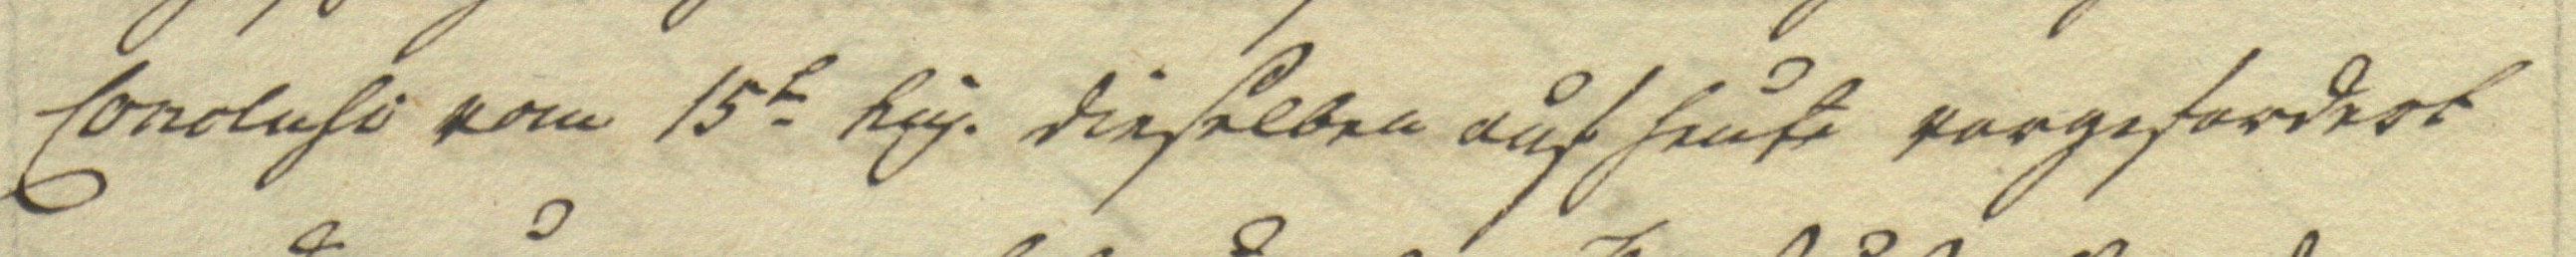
Conclusi vom 15 t. huj. dieselben auf heute vorgefordert
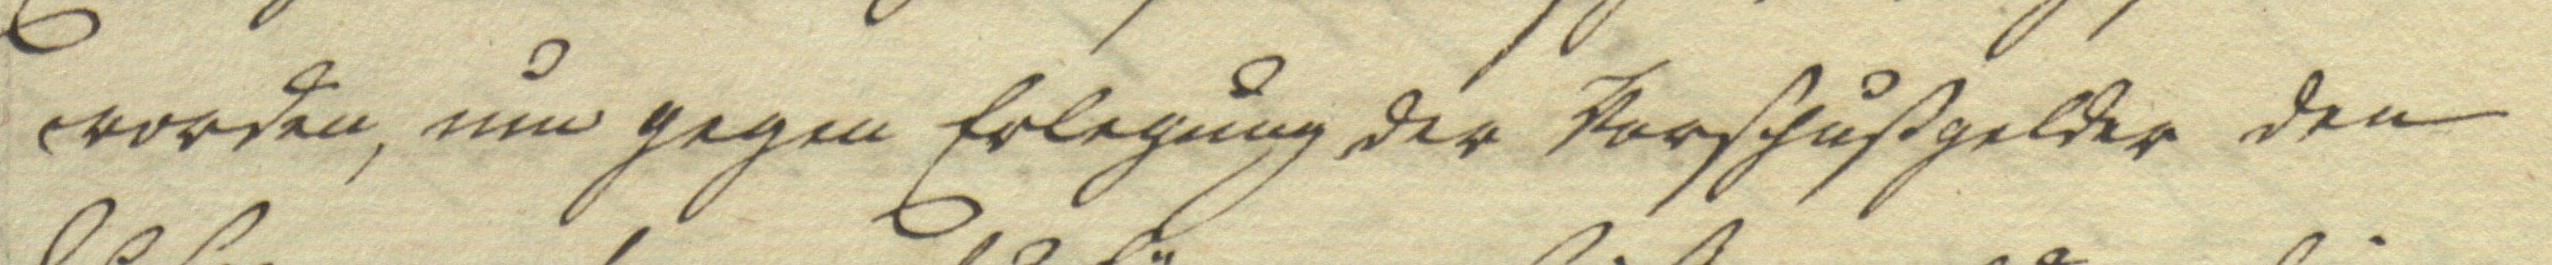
worden, um gegen Erlegung der Vorschußgelder den
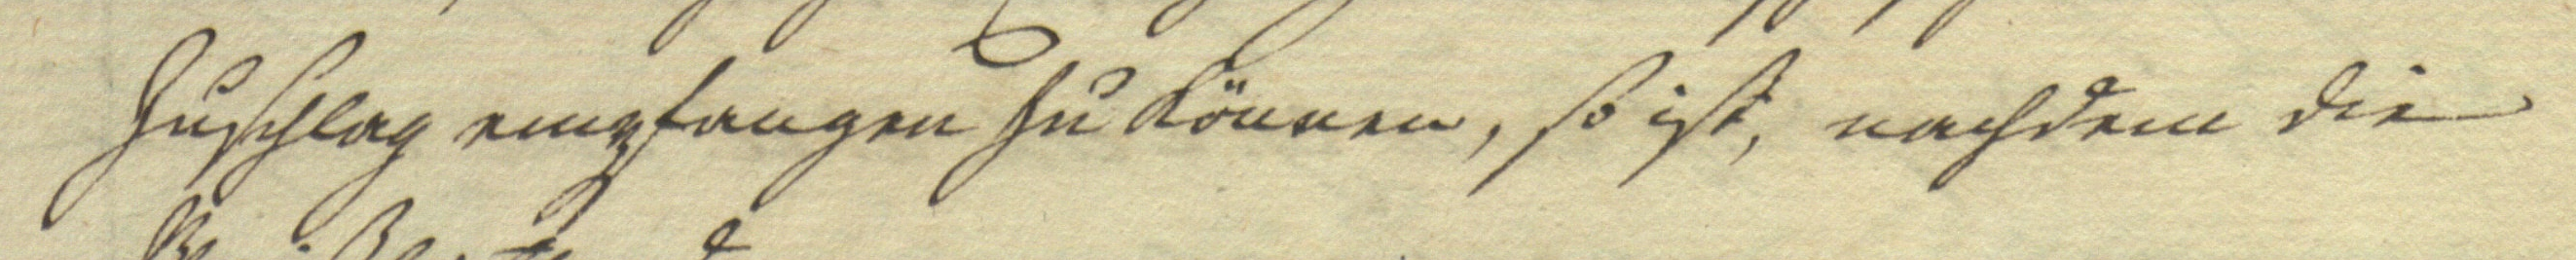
Zuschlag empfangen zu können, so ist, nachdem die
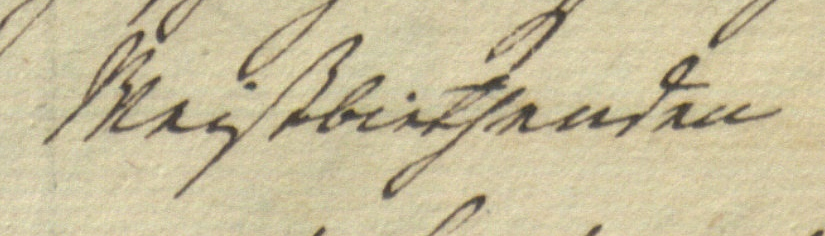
Meistbiethenden
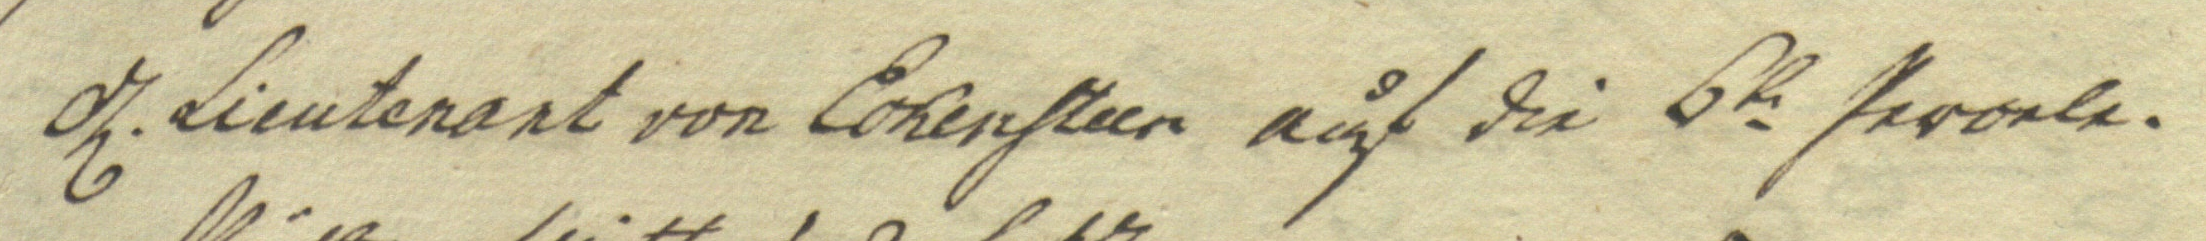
dh. Lieutenant von Eckensteen auf die 6 te Percele.
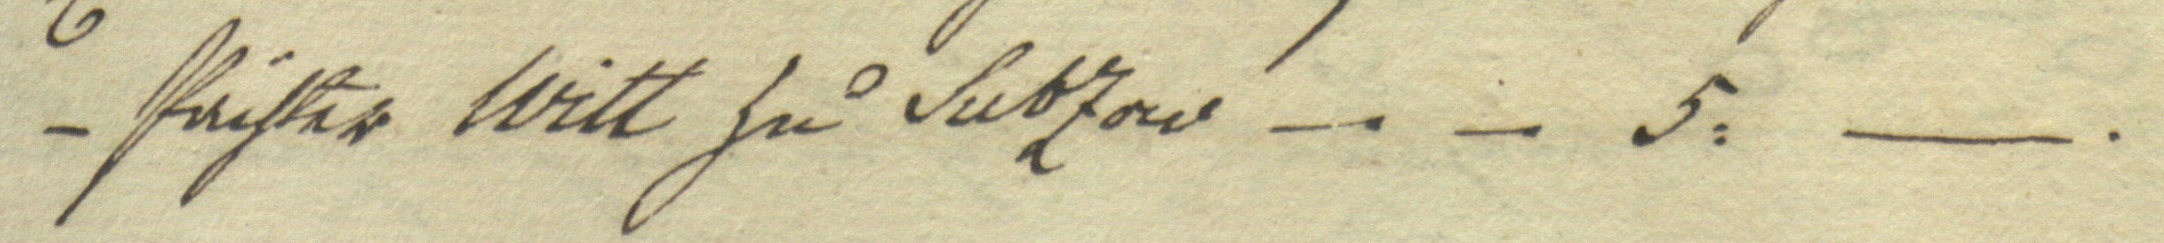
Pächter Witt zu Subzow 5.
